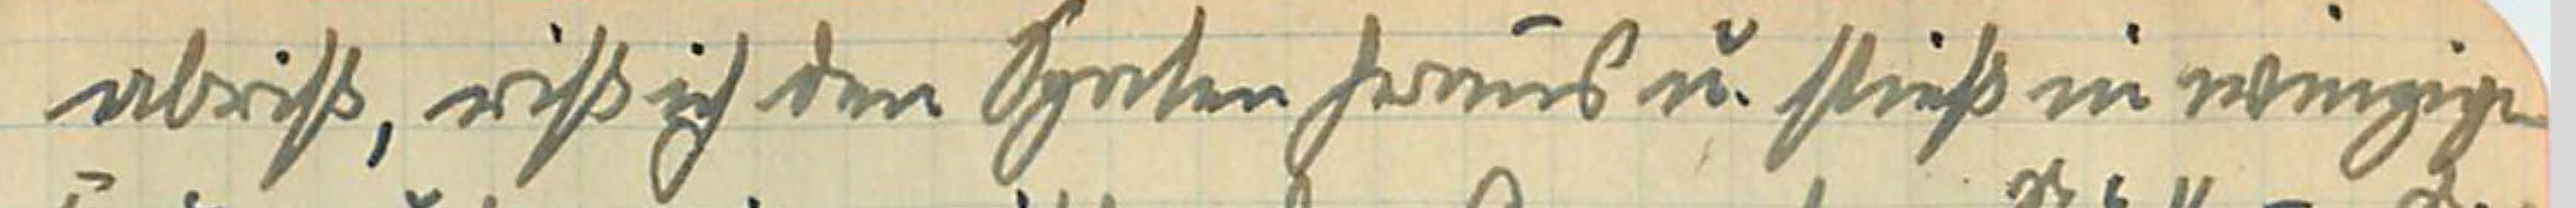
abriß, riß ich den Spaten heraus u. stieß in winzigen
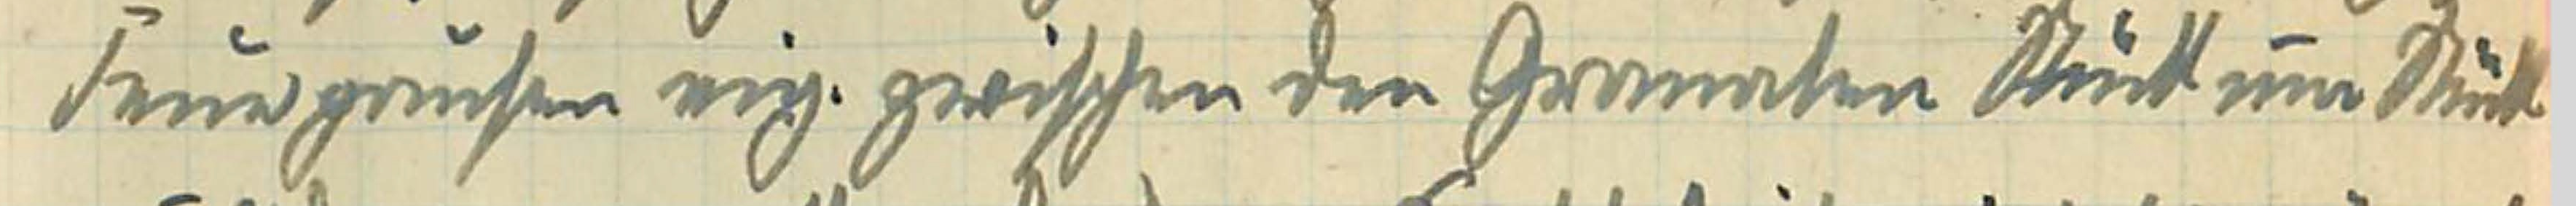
Feuerpausen eig. zwischen den Granaten Stück um Stück
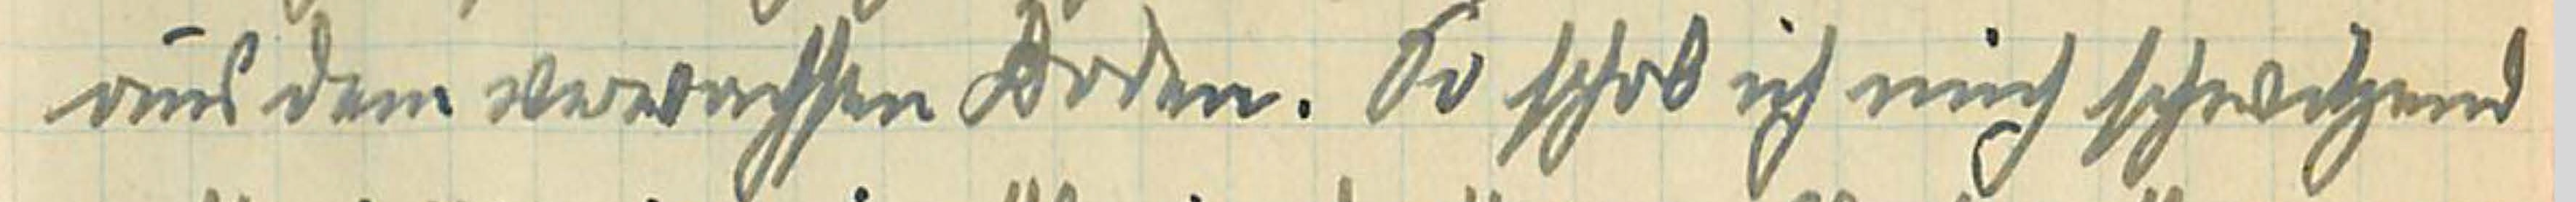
aus dem verwachsten Boden. So schob ich mich schwitzend
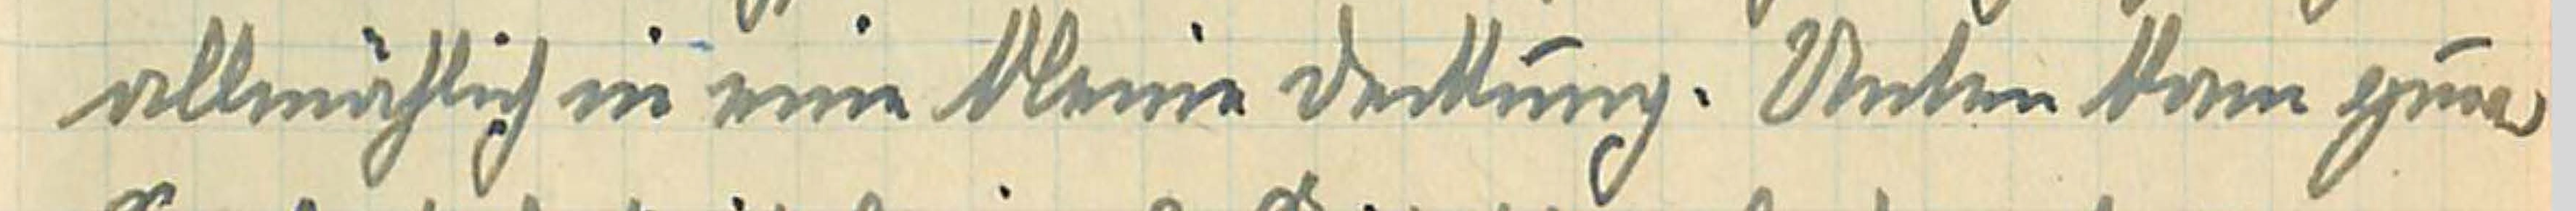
allmählich in eine kleine Deckung. Unten kam purer
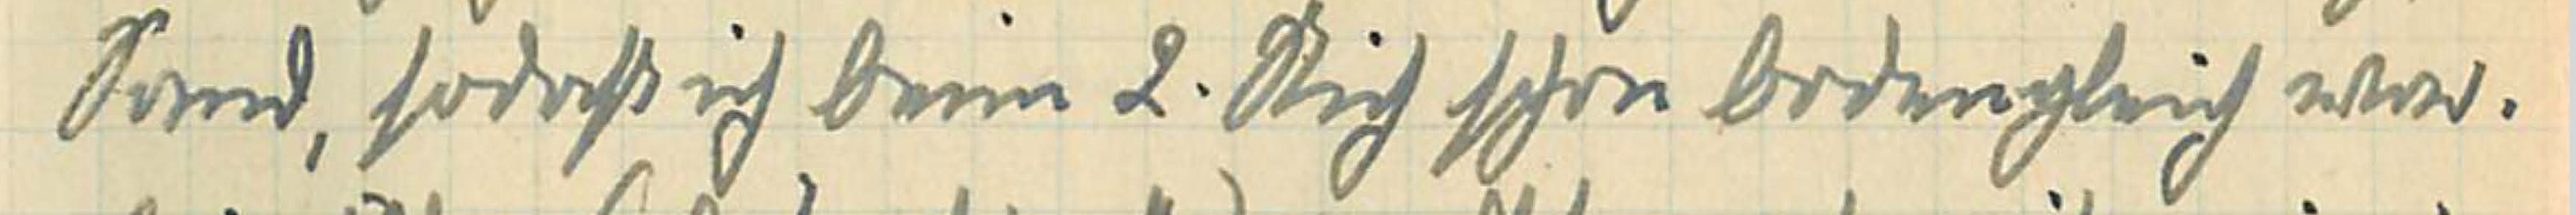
Sand, sodaß ich beim 2. Stich schon bodengleich war.
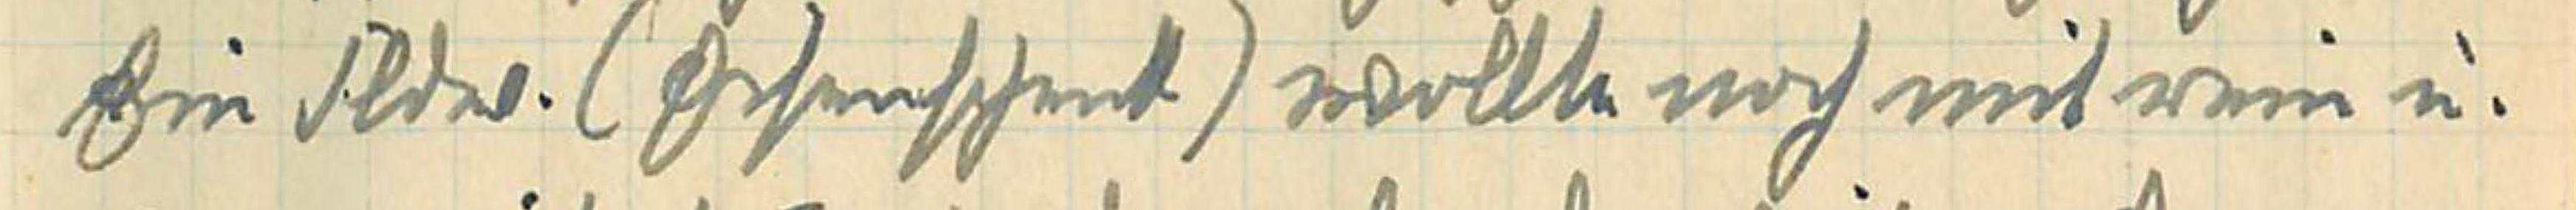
Ein Fldw. (Eisenschenk) wollte noch mit rein u.
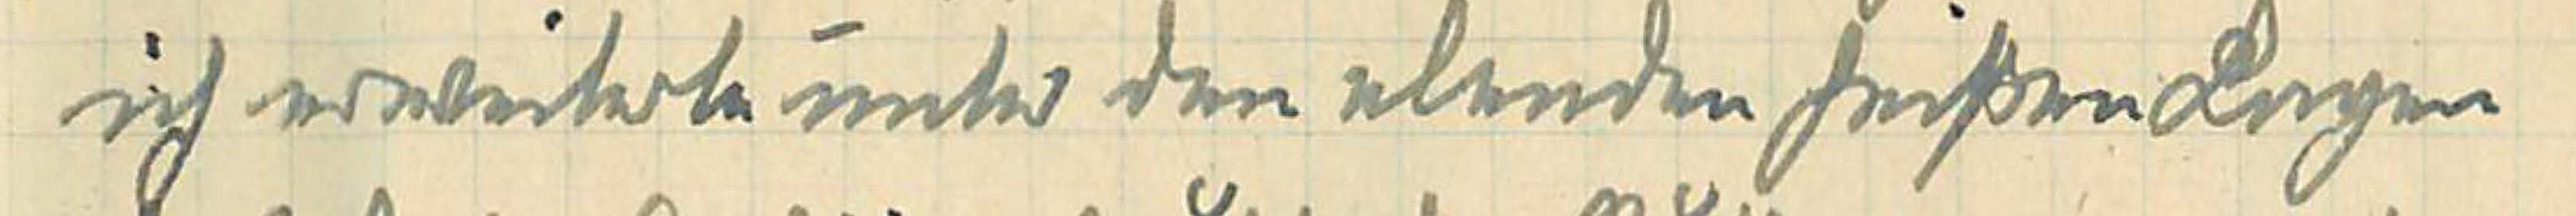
ich erweiterte unter den elenden heißen Lagen
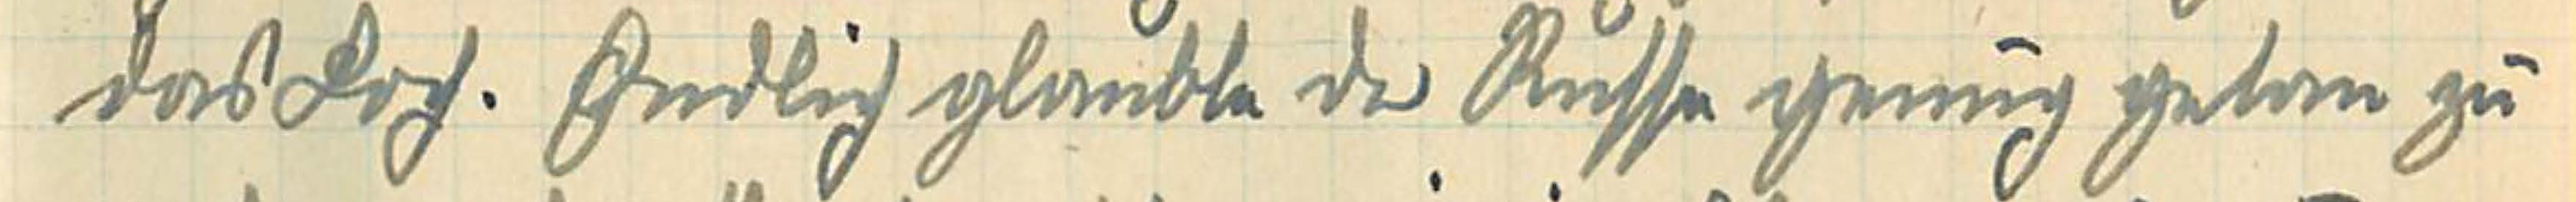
das Loch. Endlich glaubte der Russe genug getan zu
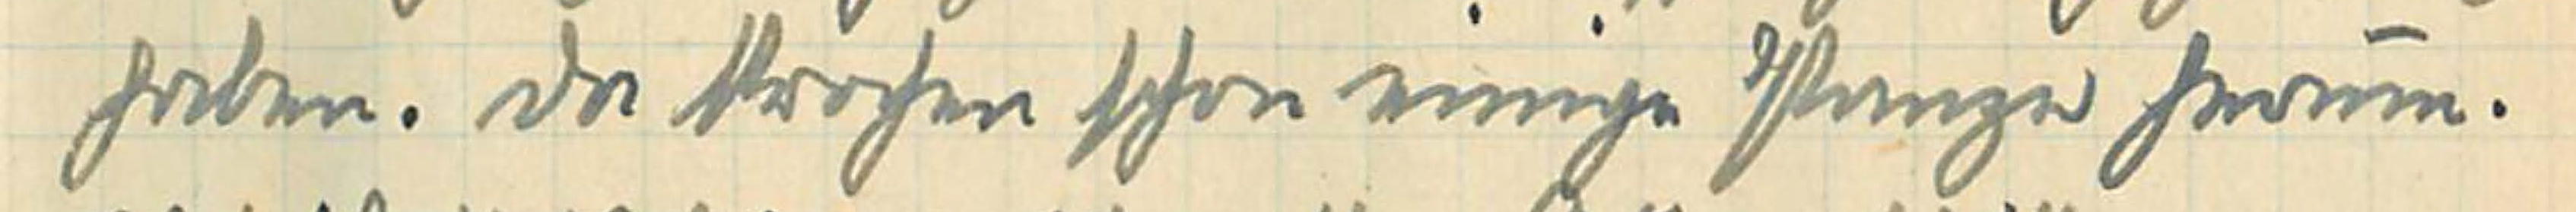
haben. Da krochen schon einige Panzer herum.
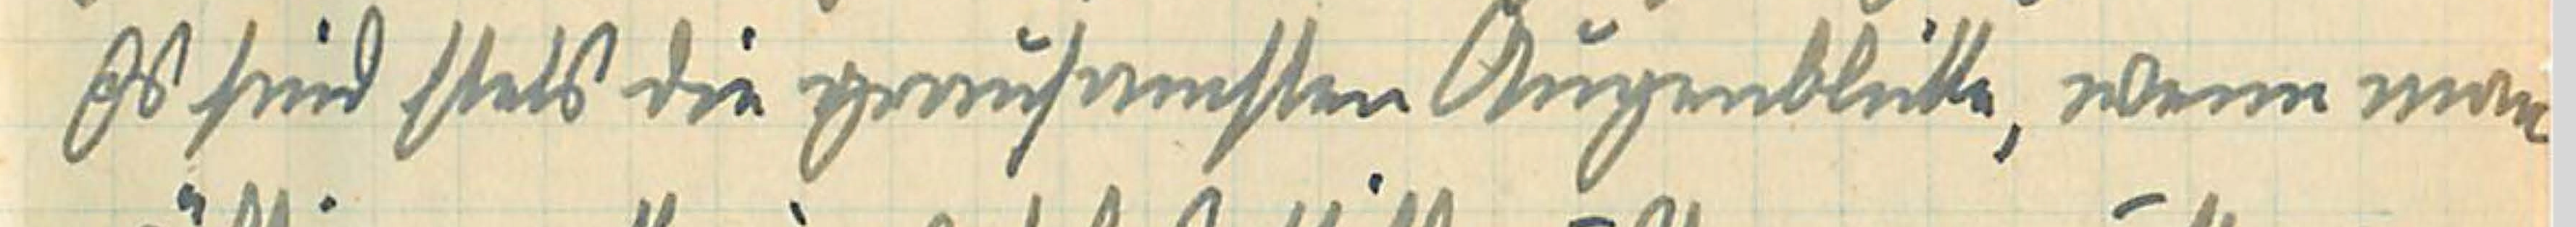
Es sind stets die grausamsten Augenblicke, wenn man
